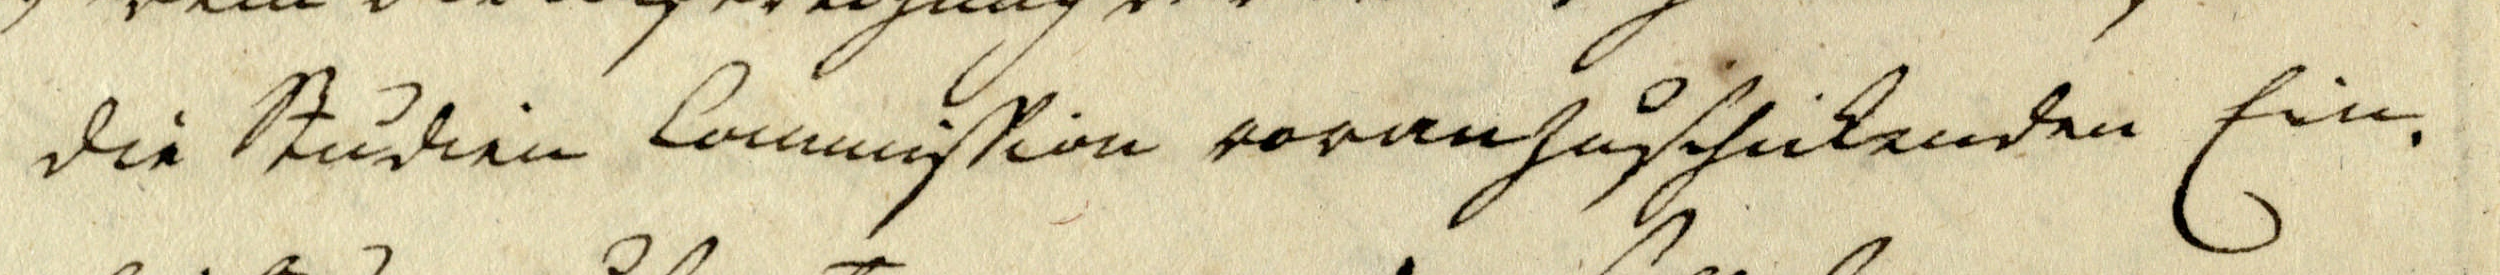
die Studien Commission voranzuschickenden Ein¬
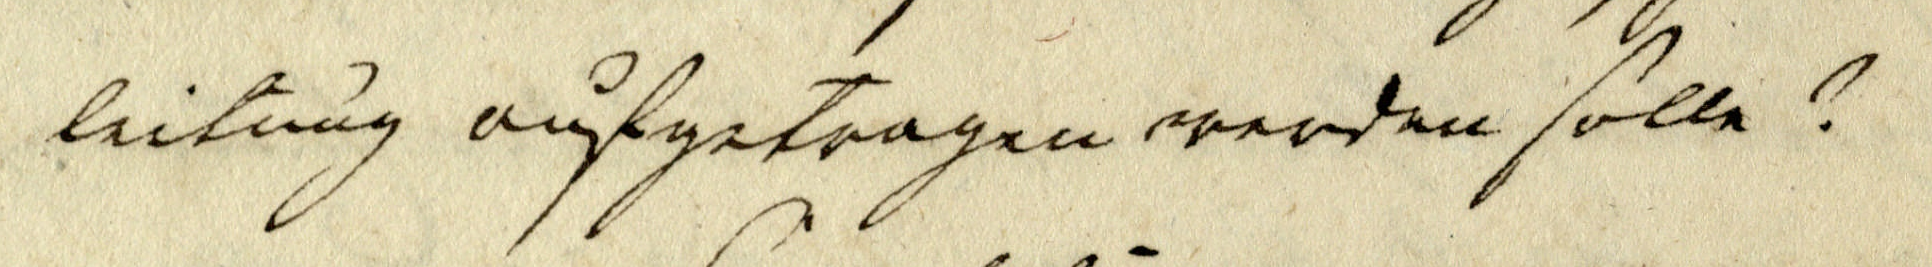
leitung aufgetragen werden solle?
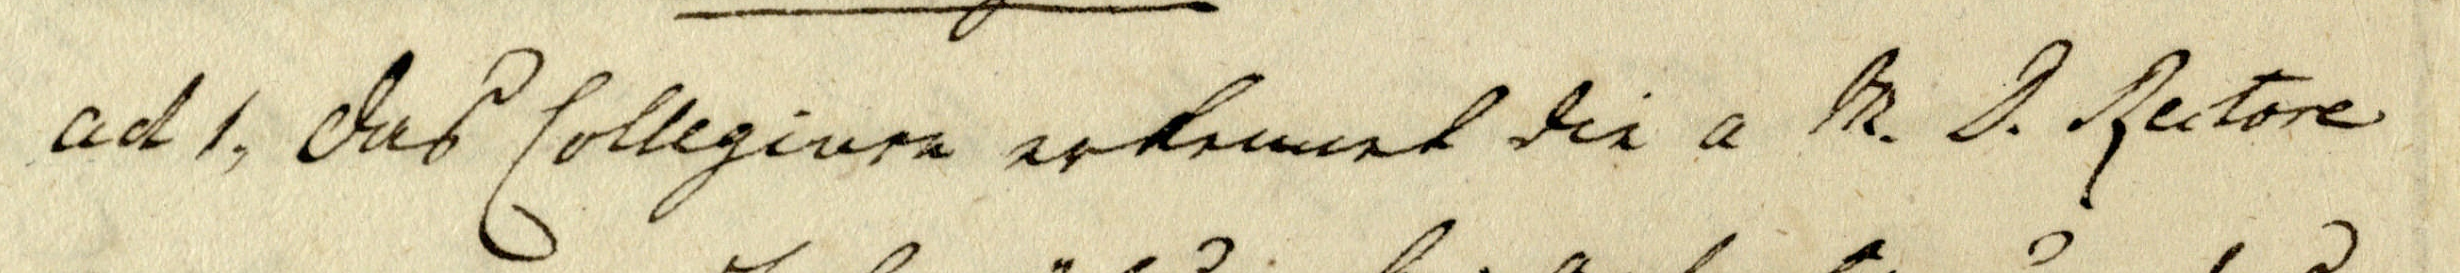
ad 1., Das Collegium erkennet die a M. D. Rectore
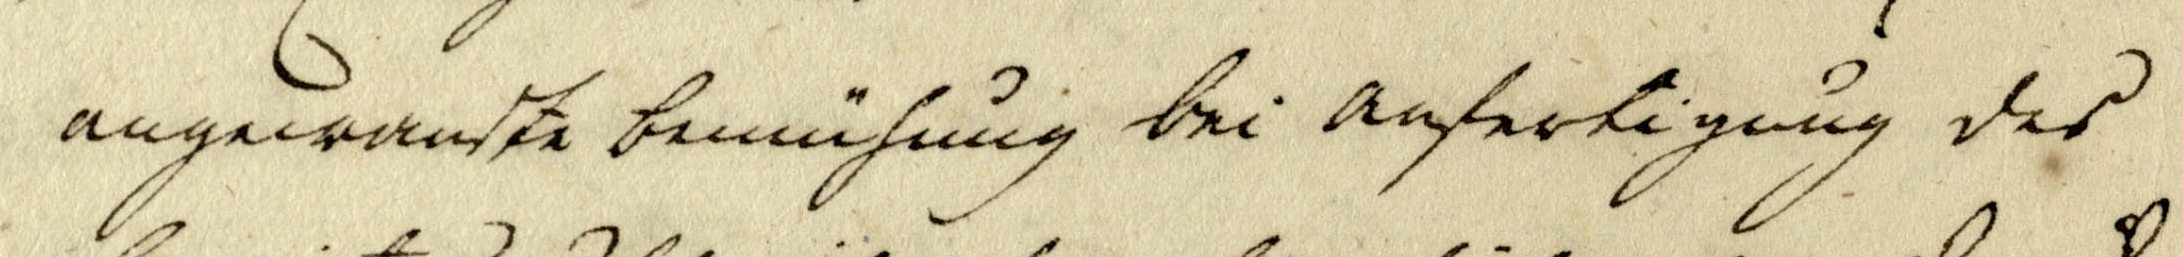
angewandte Bemühung bei Anfertigung des
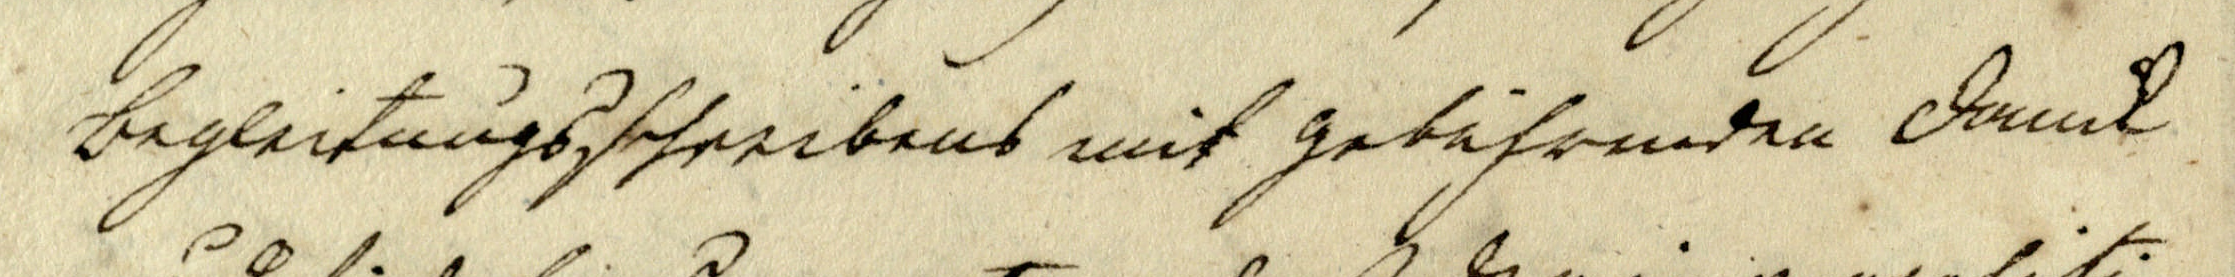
Begleitungsschreibens mit gebührenden Danck
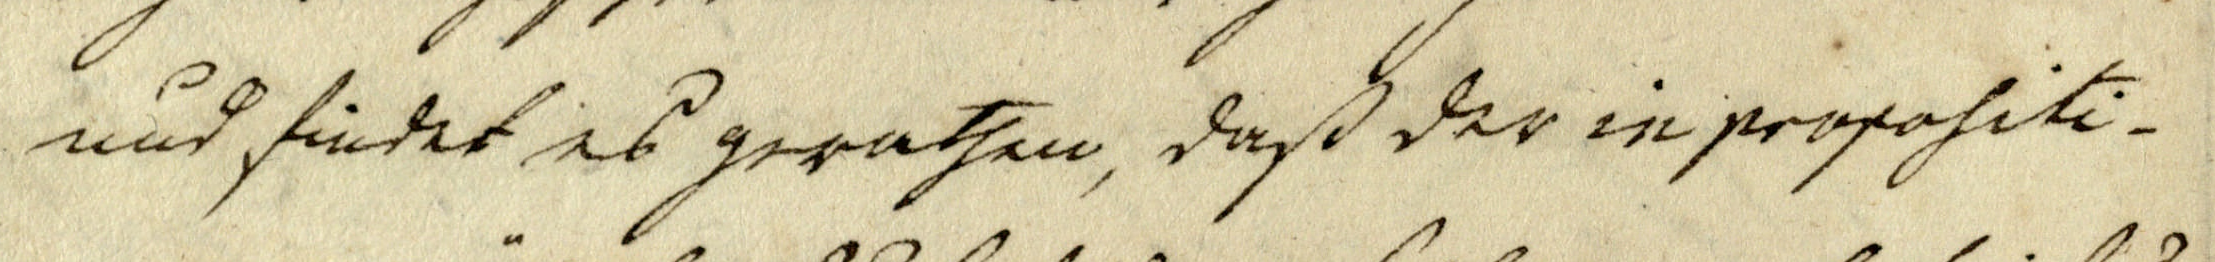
und findet es gerathen, daß der in propositi¬
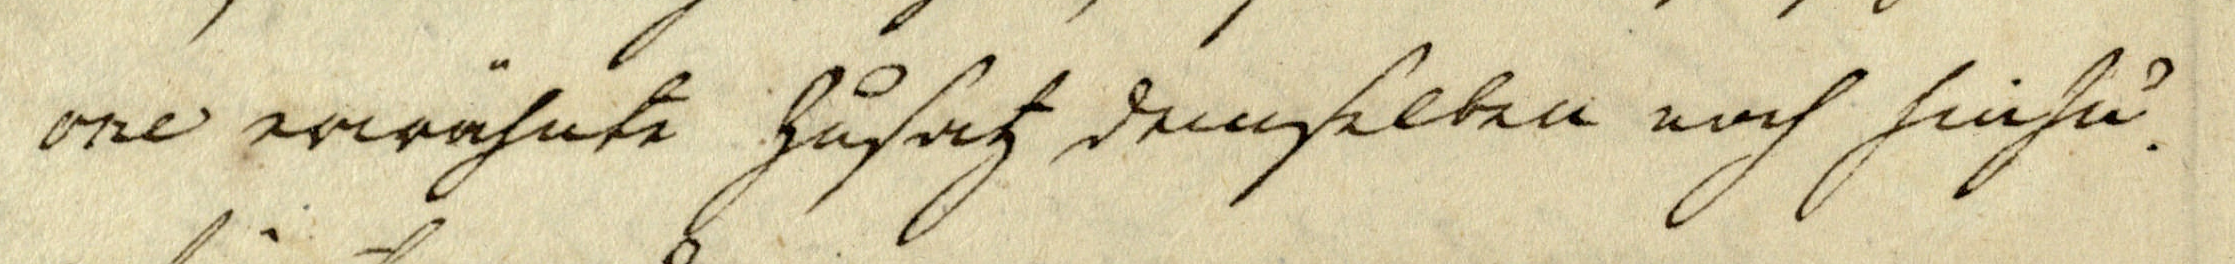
one erwähnte Zusatz demselben noch hinzu¬
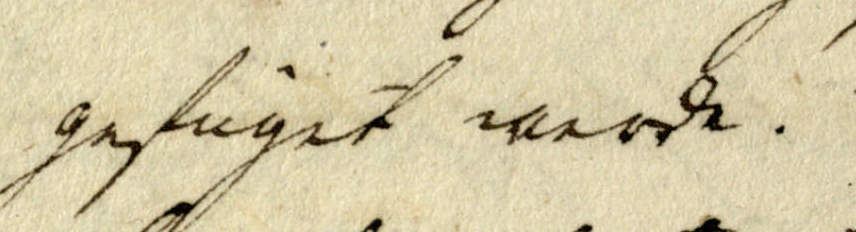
gefüget werde.
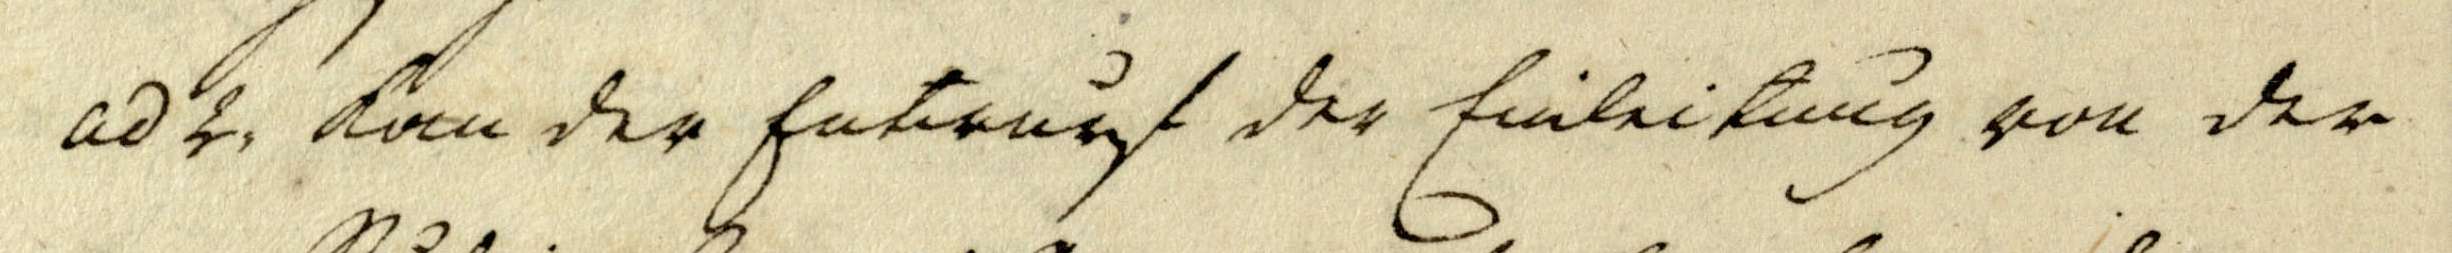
ad 2, Kan der Entwurf der Einleitung von der
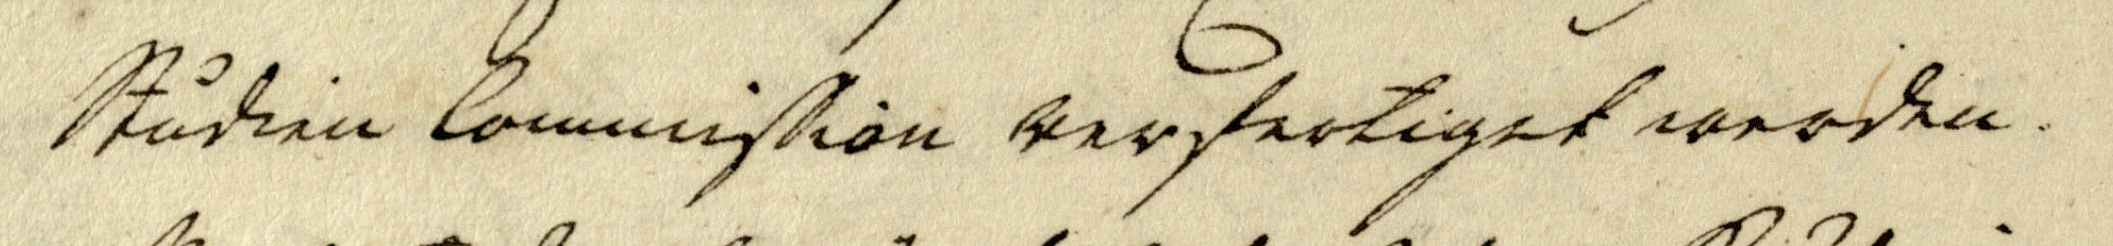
Studien Commission verfertiget werden.
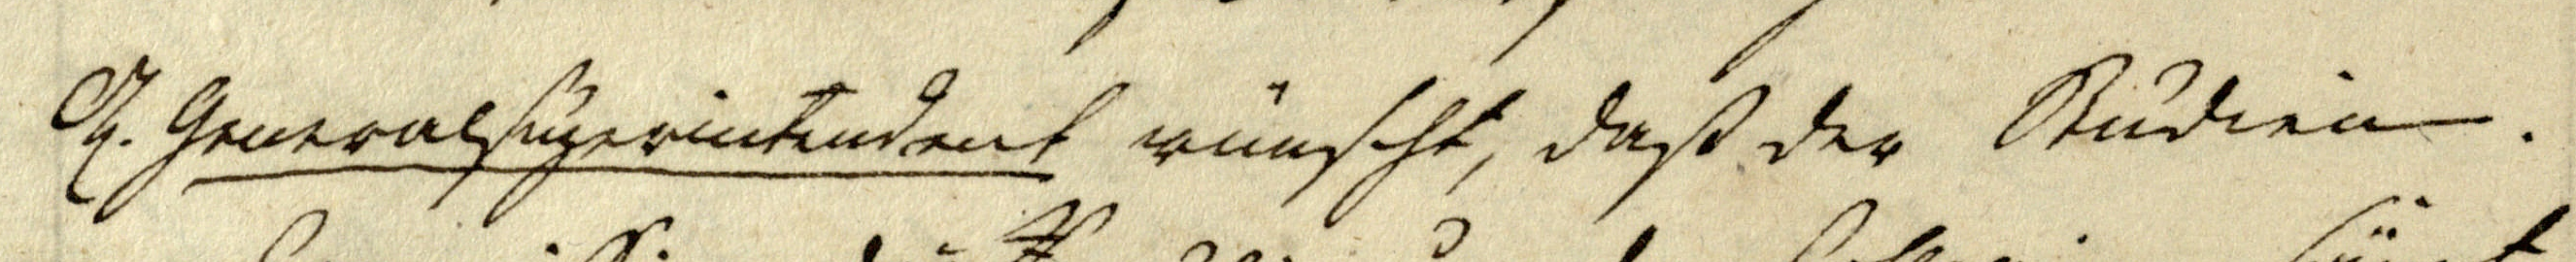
dh. Generalsuperintendent wünscht, daß der Studien¬
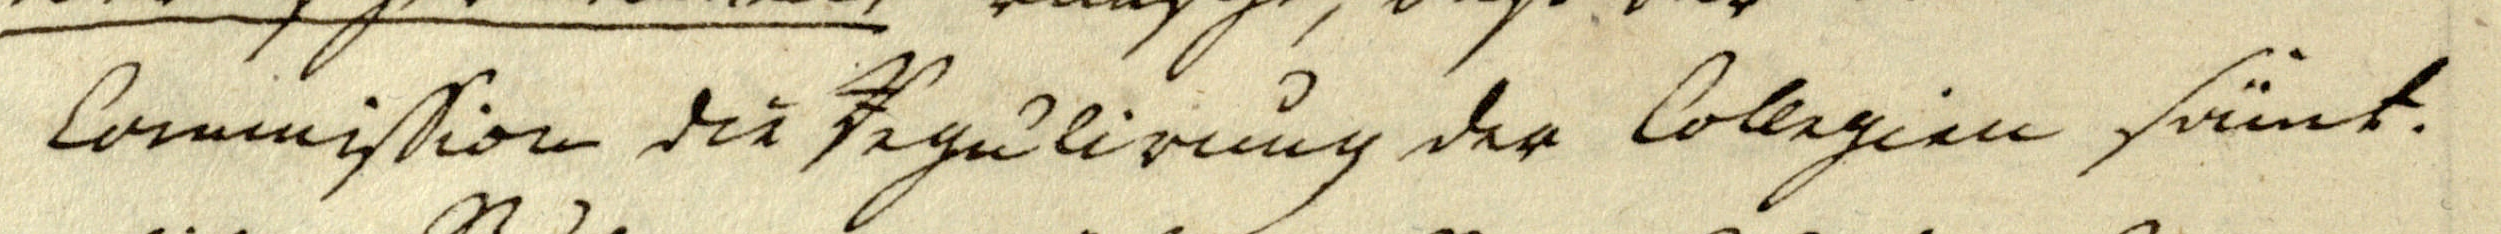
Commission die Regulirung der Collegien sämt¬
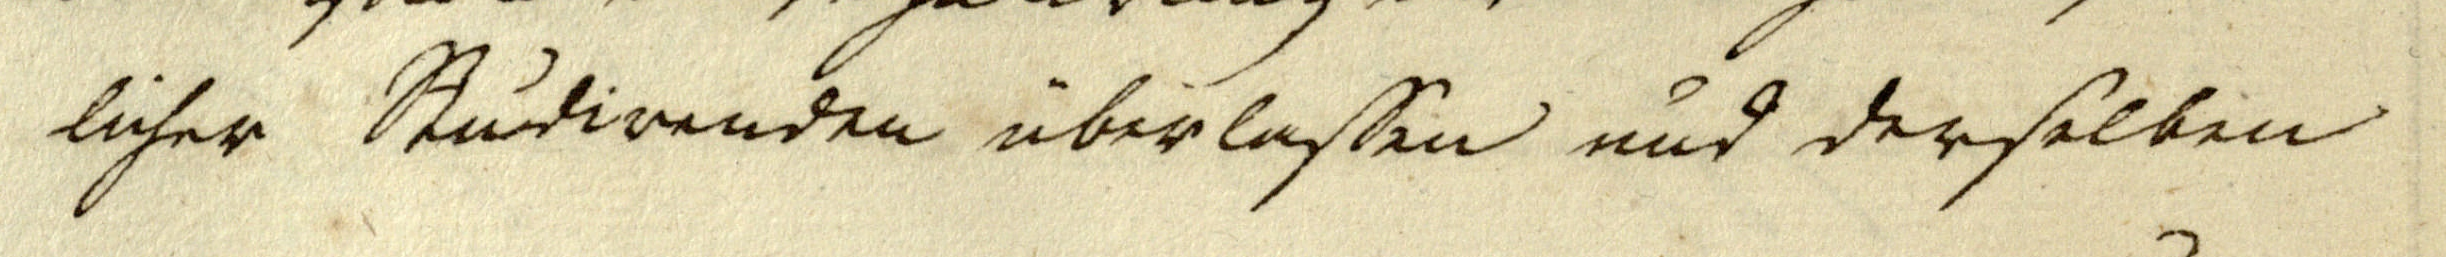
licher Studirenden überlassen und derselben
